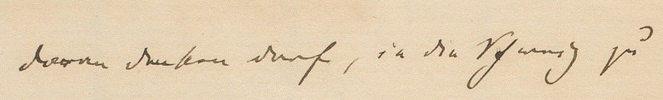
daran denken darf, in die Schweiz zu
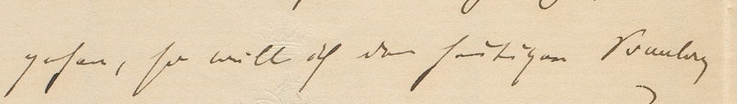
gehen, so will ich den heutigen Sonntag
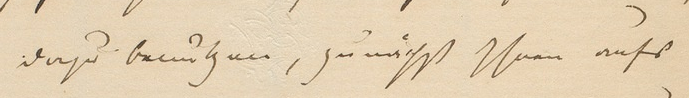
dazu benutzen, zunächst Ihnen aufs
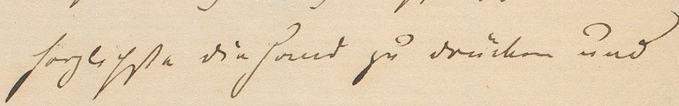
herzlichste die Hand zu drücken und
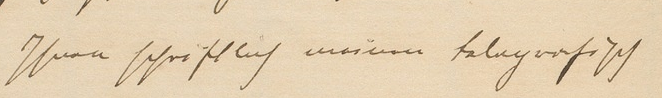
Ihnen schriftlich meinem telegrafisch
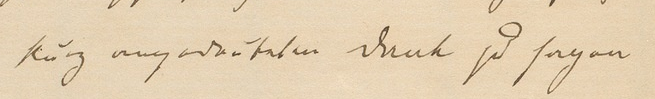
kurz angedeuteten Dank zu sagen
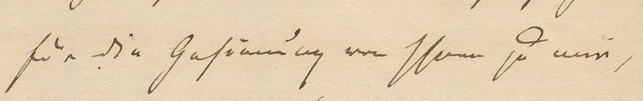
für die Gesinnung von Ihnen zu mir,
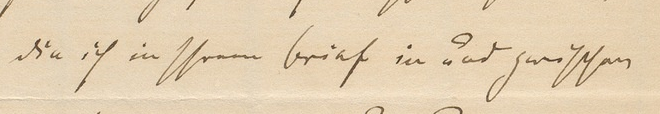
die ich in Ihrem Brief in und zwischen
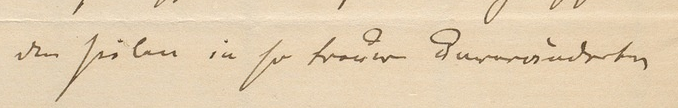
den Zeilen in so treuer unveränderter
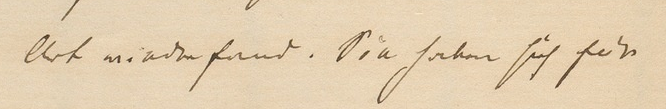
Art wiederfand. Sie haben sich für
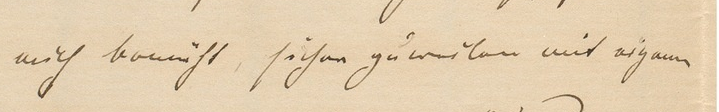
mich bemüht, sicher zuweilen mit eigener
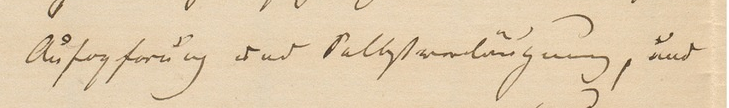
Aufopferung und Selbstverläugnung, und
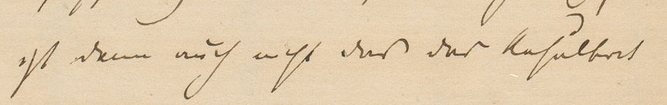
ist denn auch nicht das das Resultat
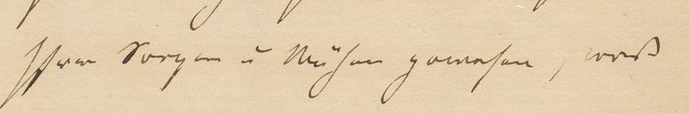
Ihrer Sorgen u Mühen gewesen, was
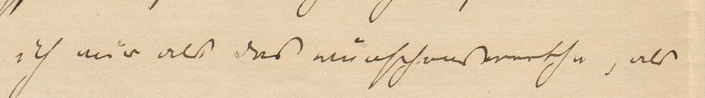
ich mir als das wünschenswerthe, als
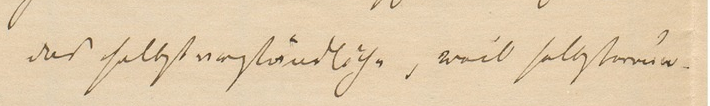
das selbstverständliche, weil selbsterrun-
